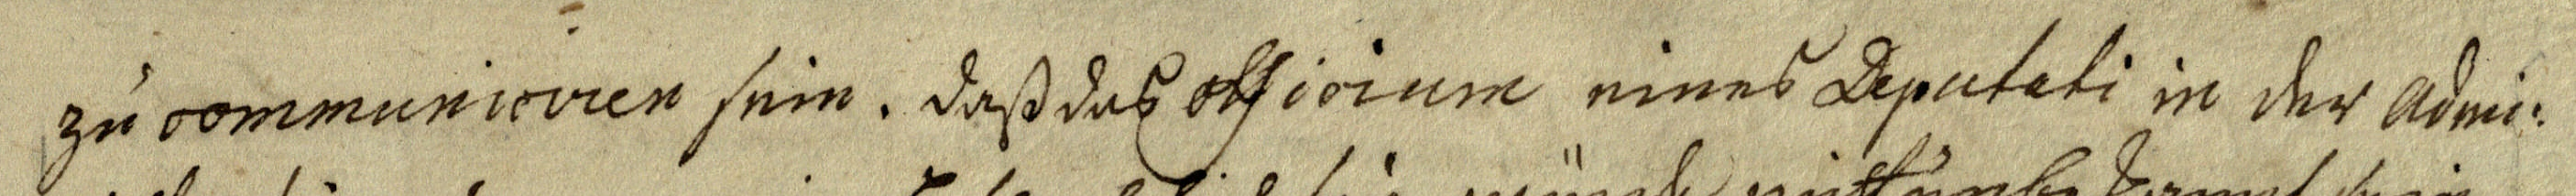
zu communiciren sein. Daß das officium eines Deputati in der Admi¬
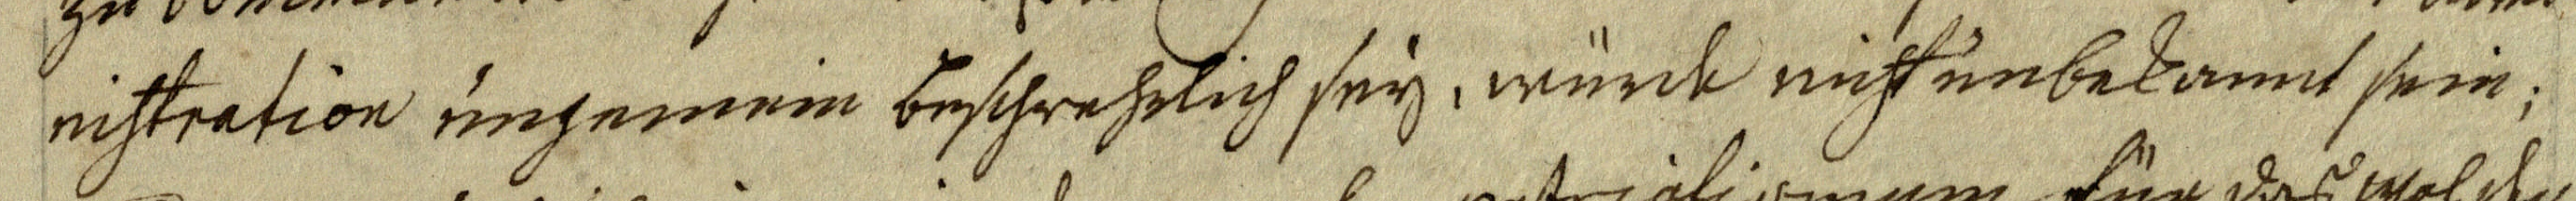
nistration ungemein beschwehrlich seÿ, würde nicht unbekannt sein;
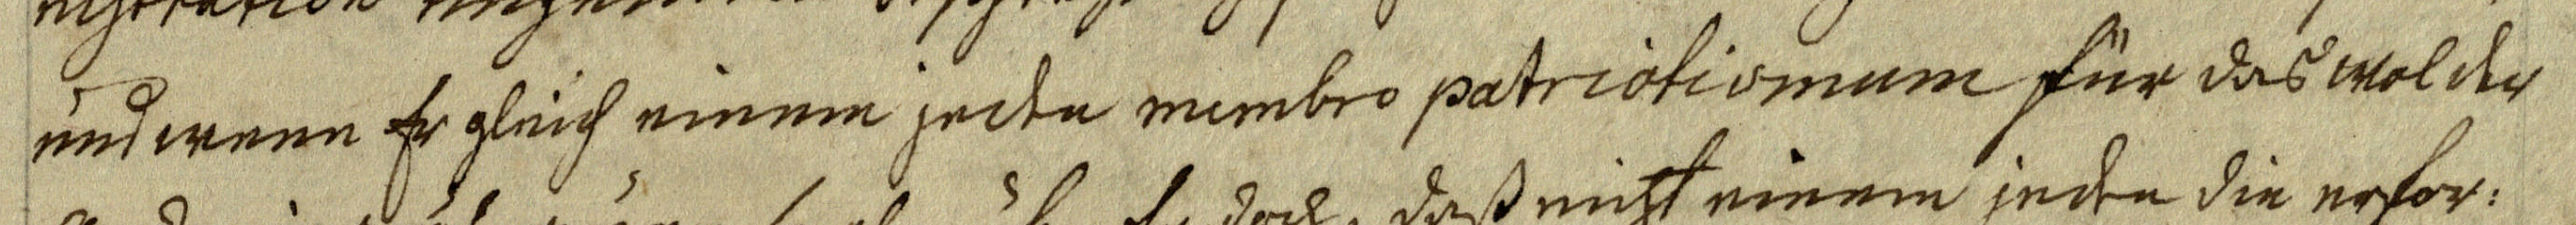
und wenn Er gleich einem jeden membro patriotiomum für das wol der
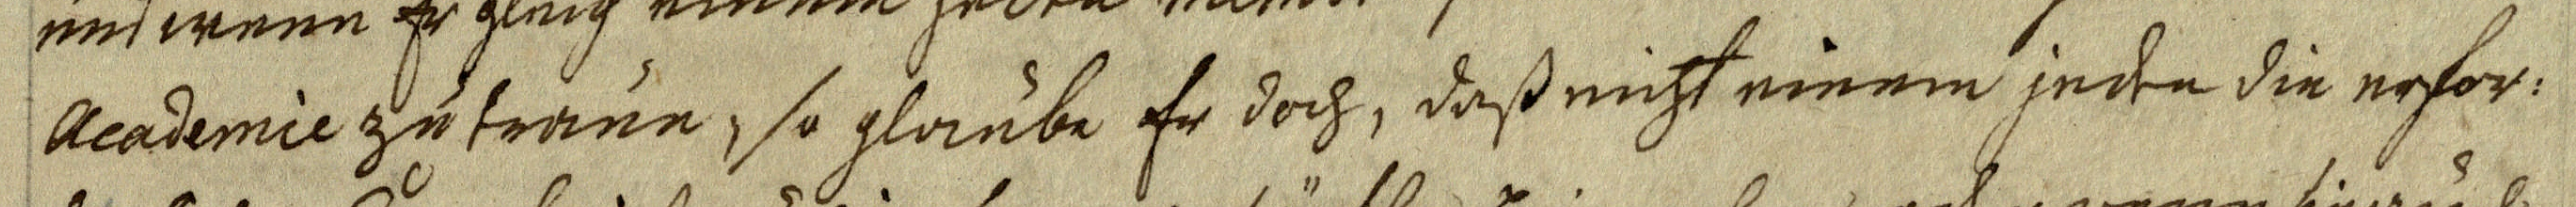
Academie zutraue, so glaube Er doch, daß nicht einem jeden die erfor¬
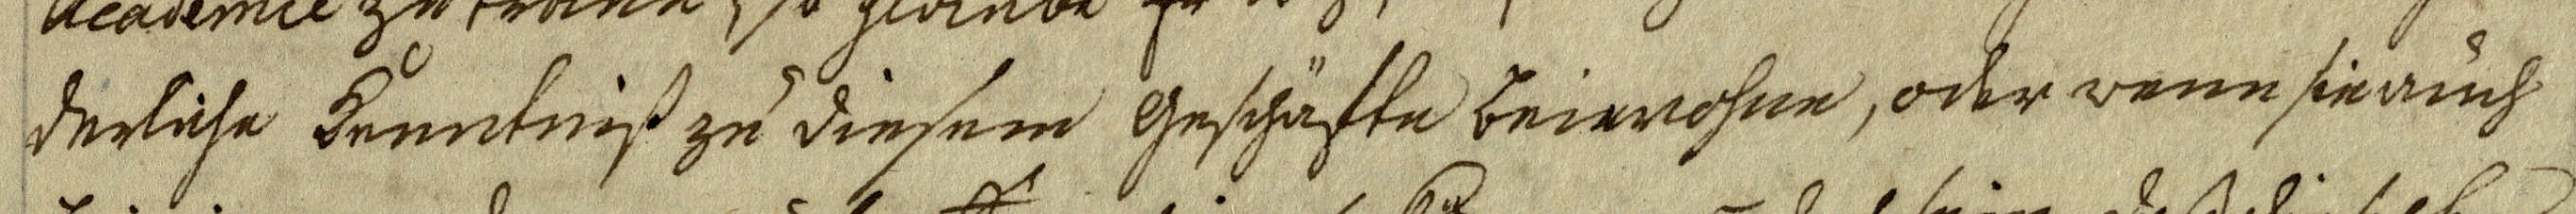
derliche Kenntniß zu diesem Geschäfte beiwohne, oder wenn sie auch
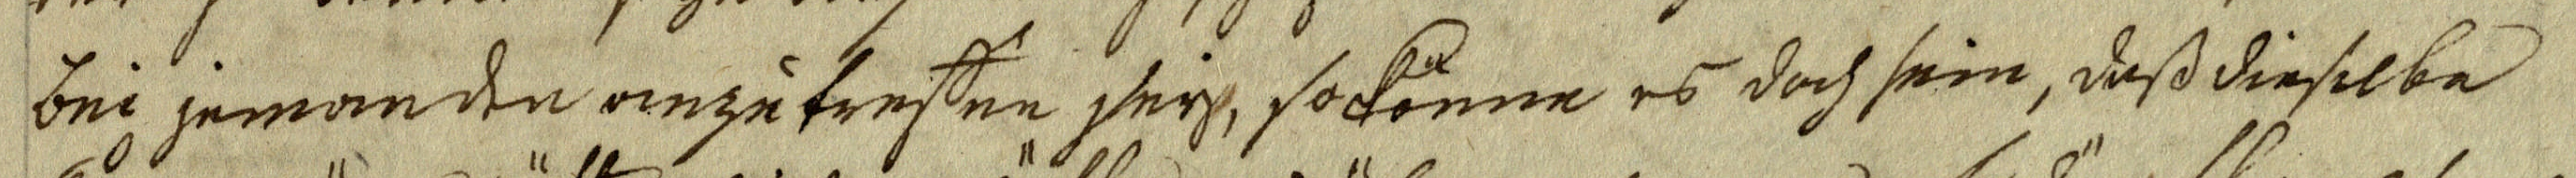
bei jemanden anzutreffen seÿ, so könne es doch sein, daß dieselbe
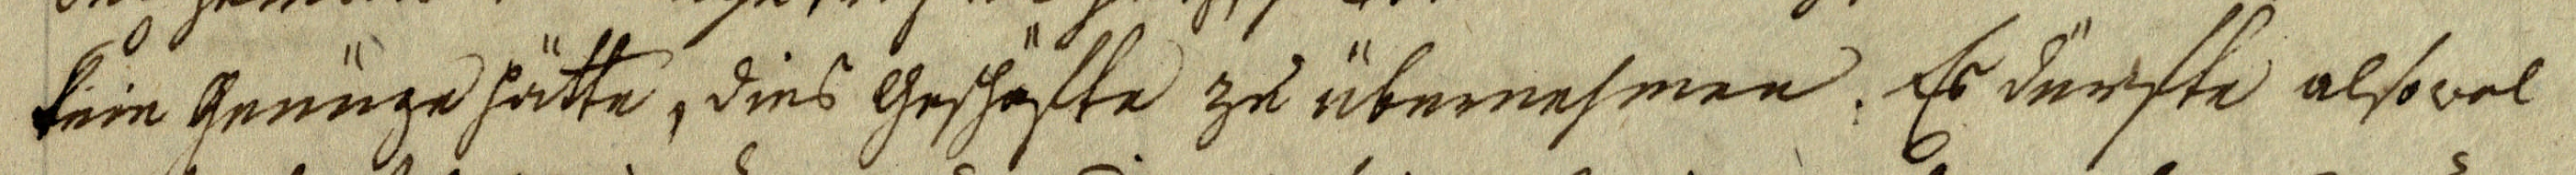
kein Genüge hätte, dies Geschäfte zu übernehmen. Es dürfte also wol
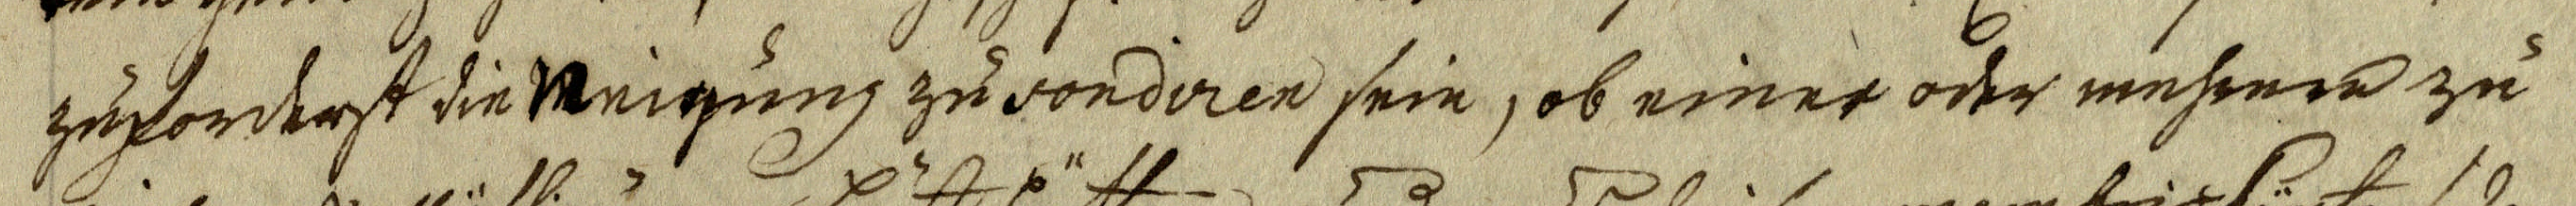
zuforderst die Neigung zu sondiren sein, ob einer oder mehrere zu
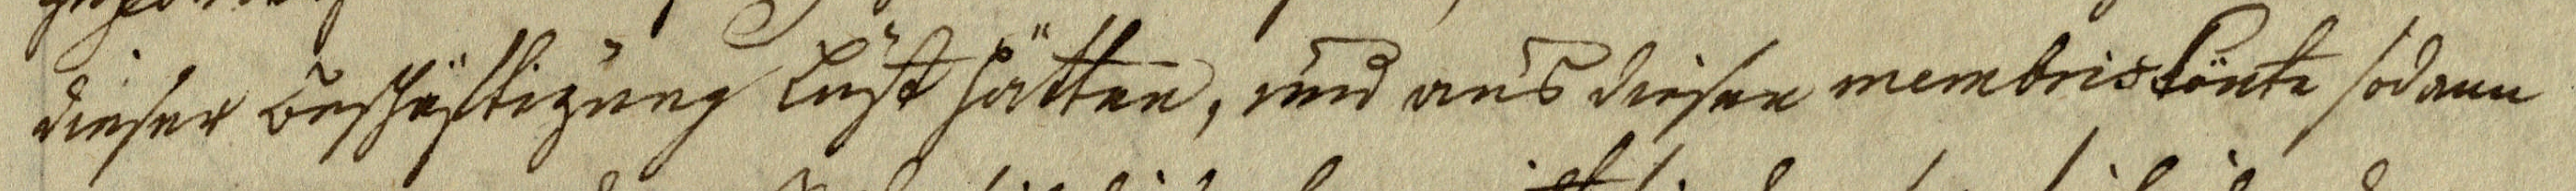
dieser Beschäftigung Lust hätten, und aus diesen membris könte sodann
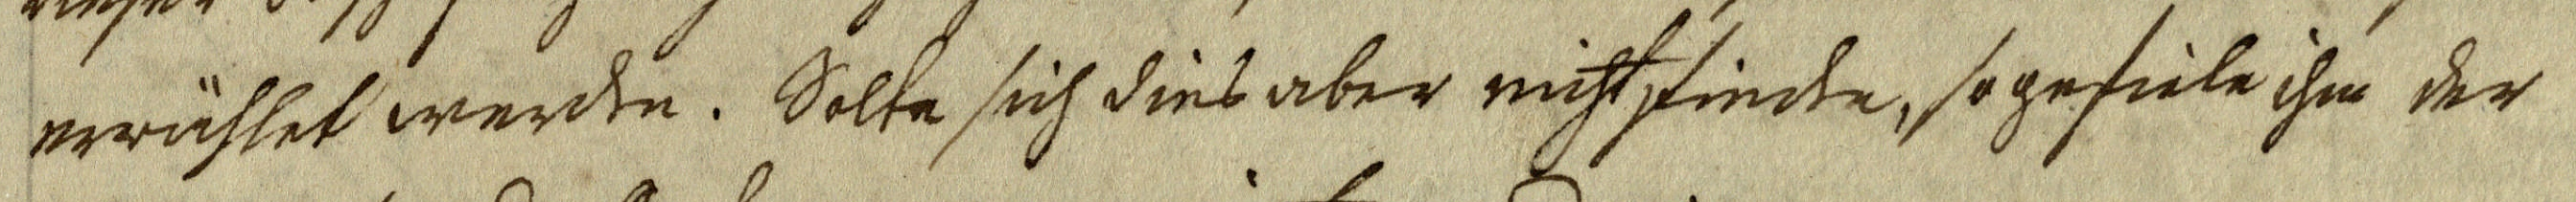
erwählet werden. Solte sich dies aber nicht finden, so gefiele ihm der
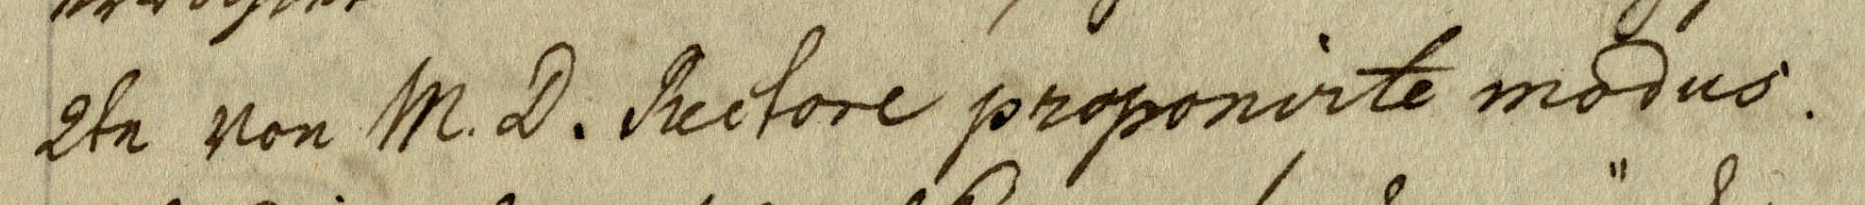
2te von M. D. Rectore proponirte modus.
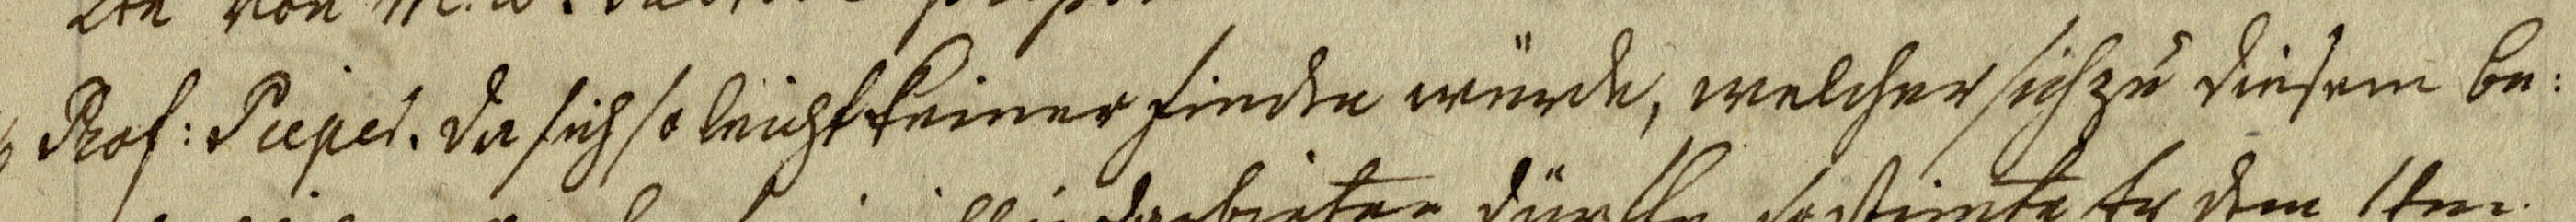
dh Prof. Pieper. Da sich so leicht keiner finden würde, welcher sich zu diesem be¬
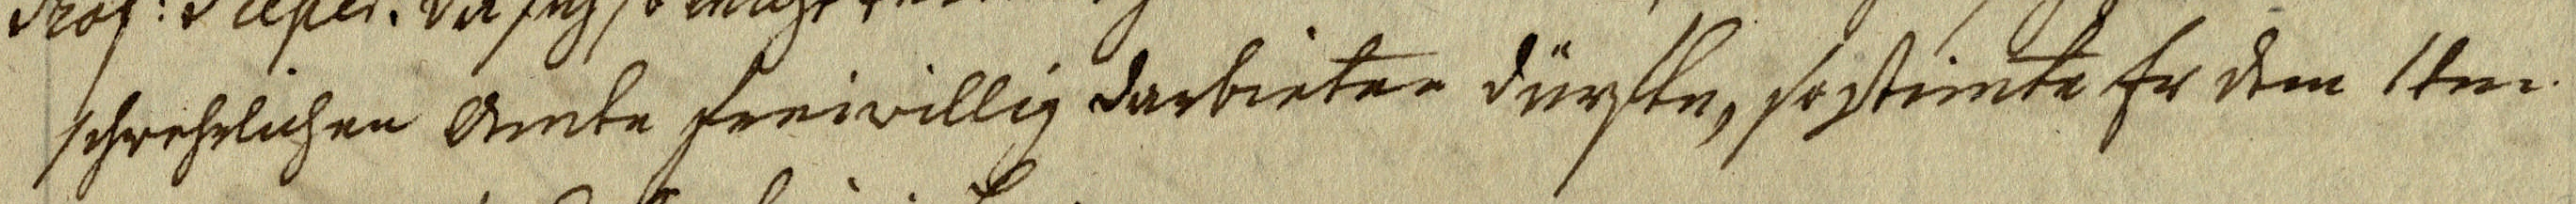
schwehrlichen Amte freiwillig darbieten dürfte, so stimte Er dem 1ten
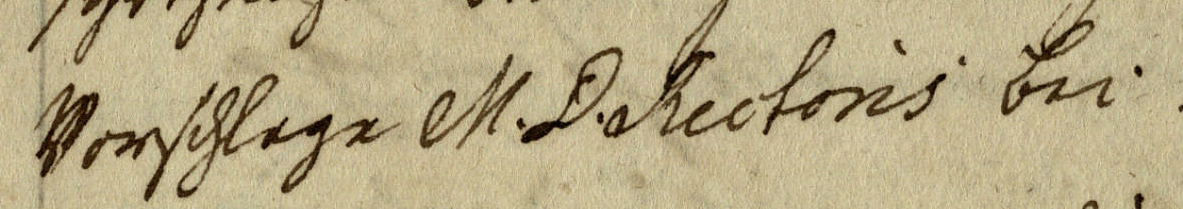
Vorschlage M. D. Rectoris bei.
